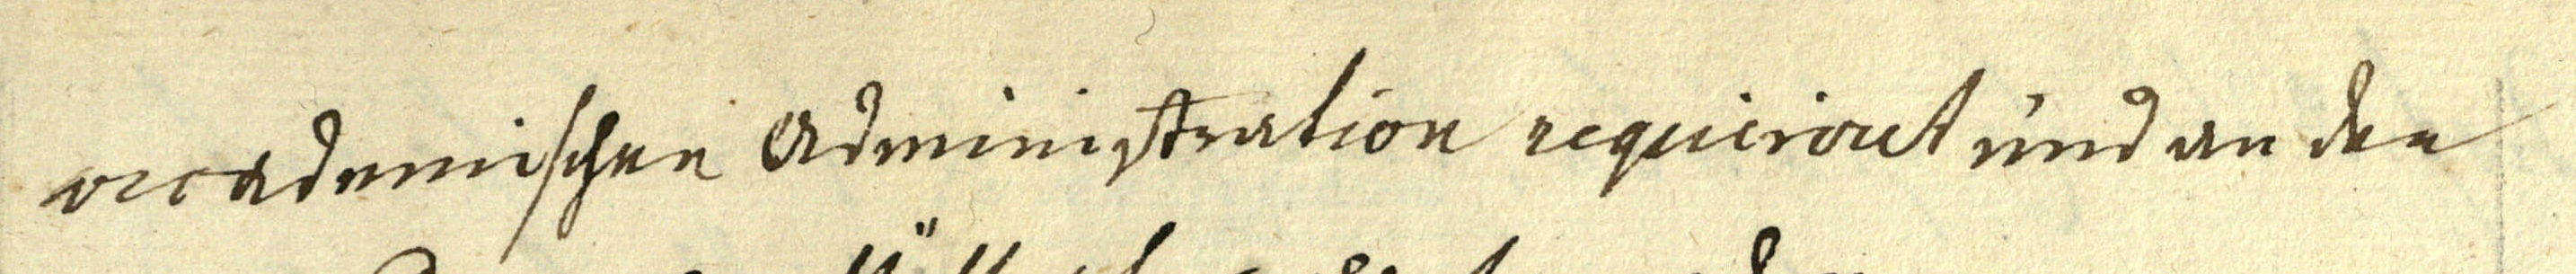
academischen Administration requiriret und an den
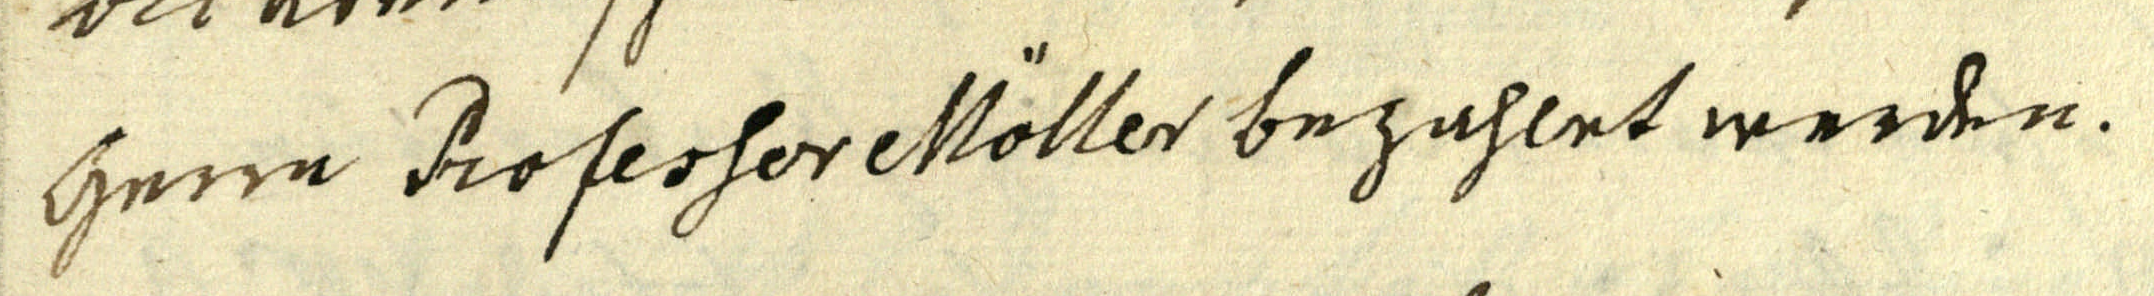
Herrn Professor Möller bezahlet werden.
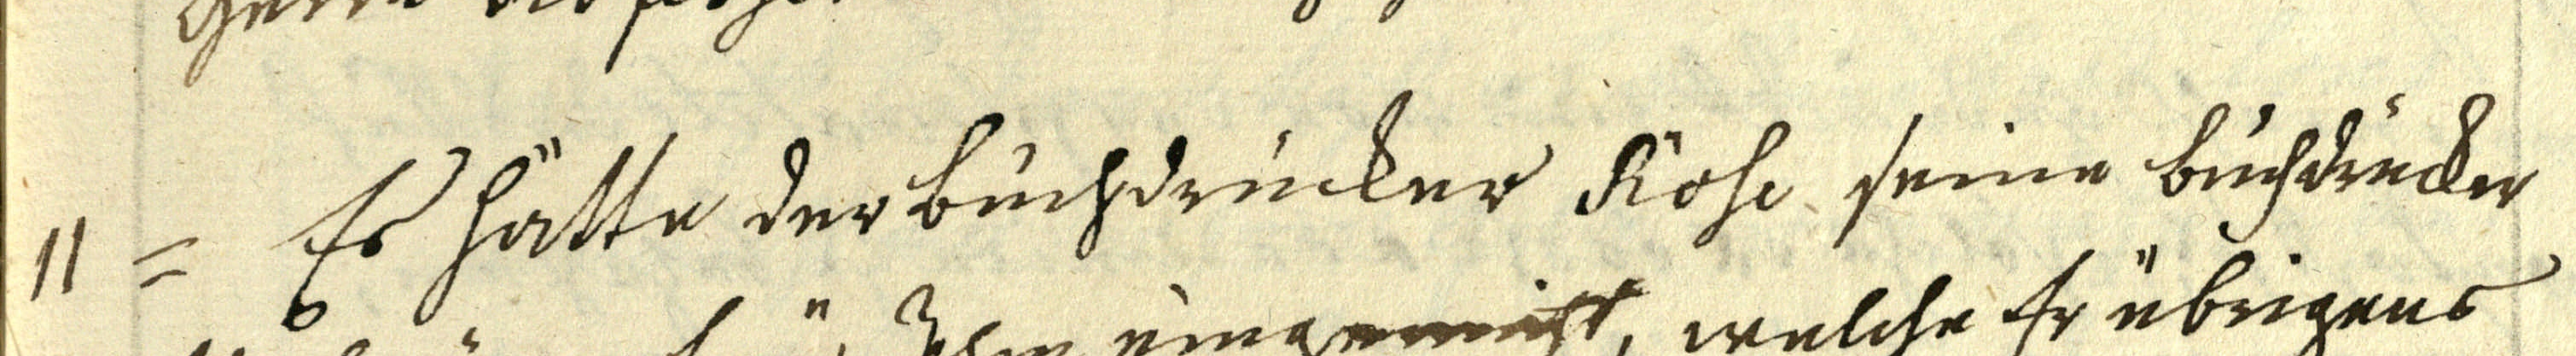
11 Es hätte der Buchdrucker Röse seine Buchdrucker
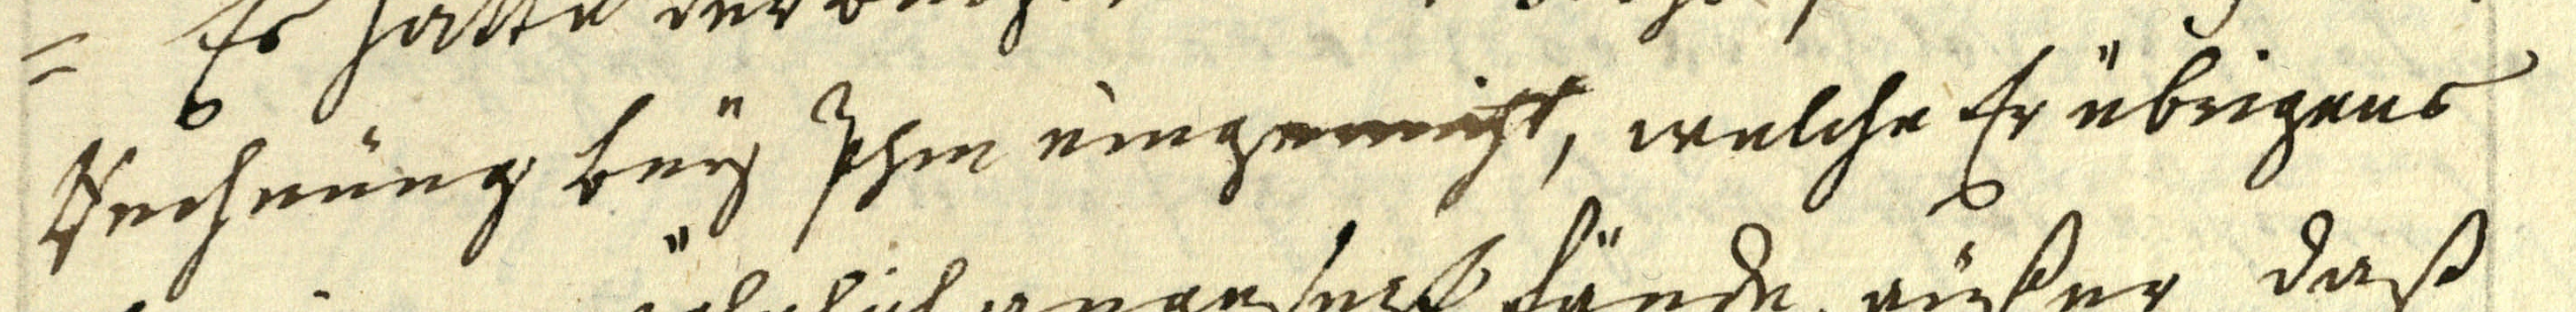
Rechnung beÿ Ihm eingereicht, welche Er übrigens
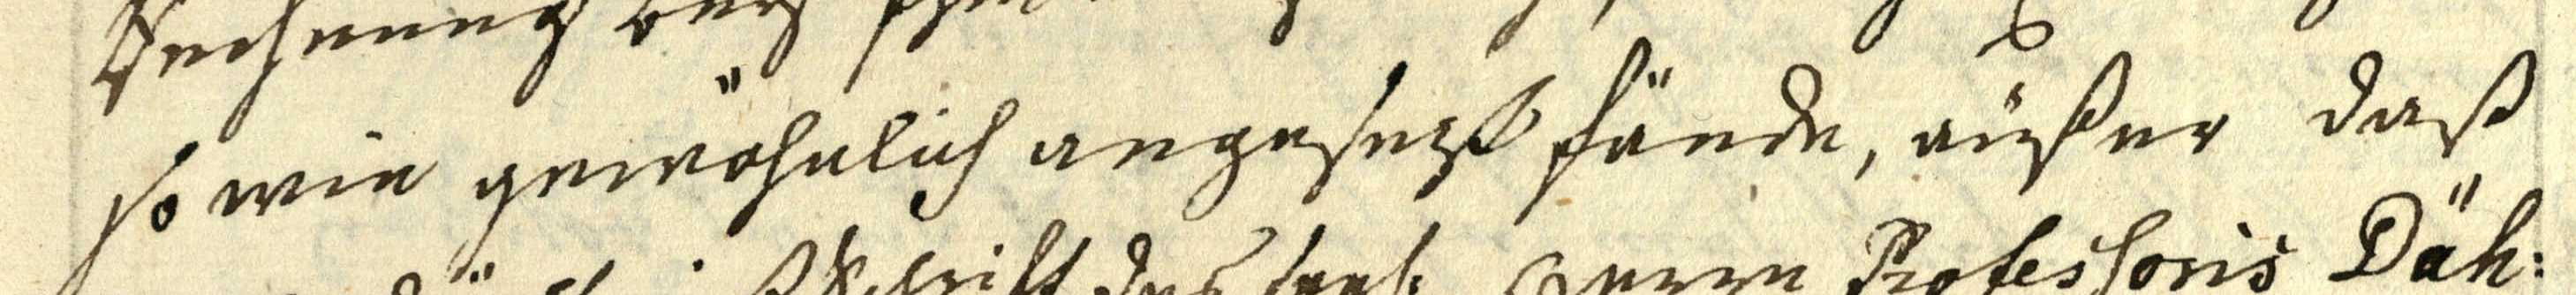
so wie gewöhnlich angesezt fände, außer daß
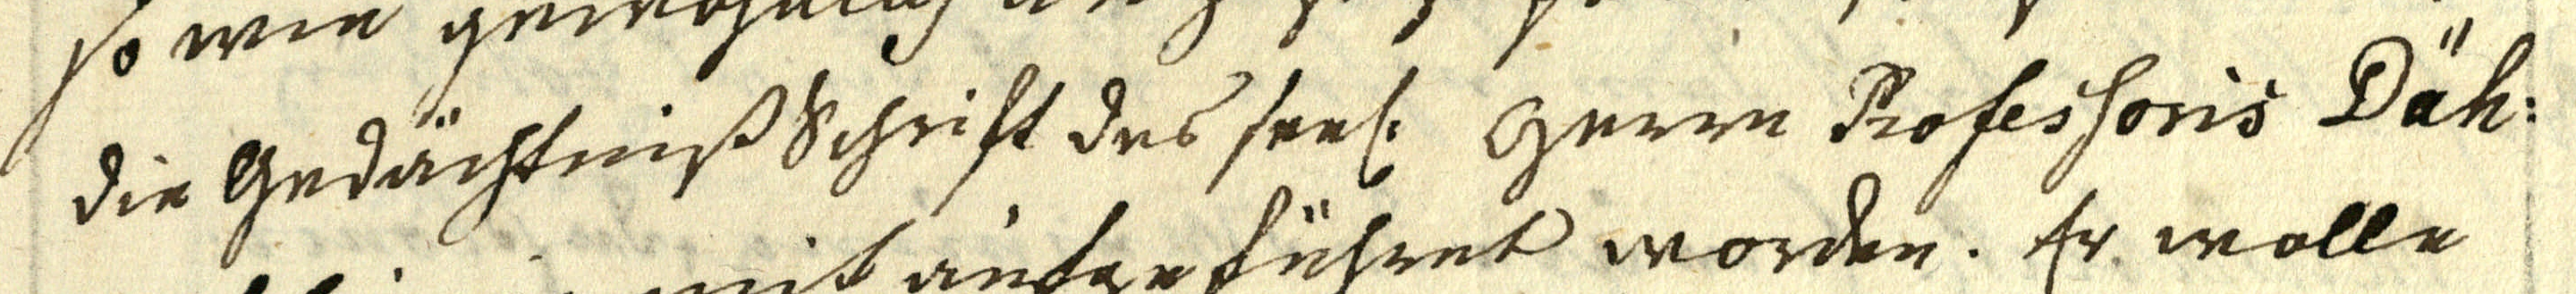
die Gedächtniß Schrift des seel. Herrn Professoris Däh¬
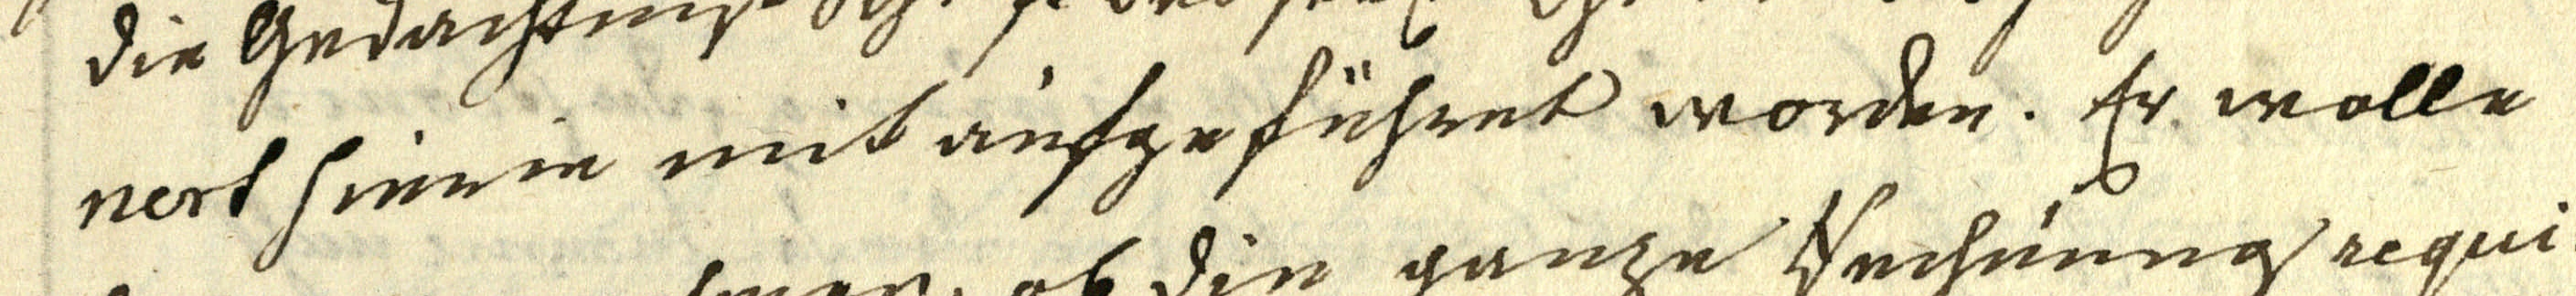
nert hierin mit aufgeführet worden. Er wolle
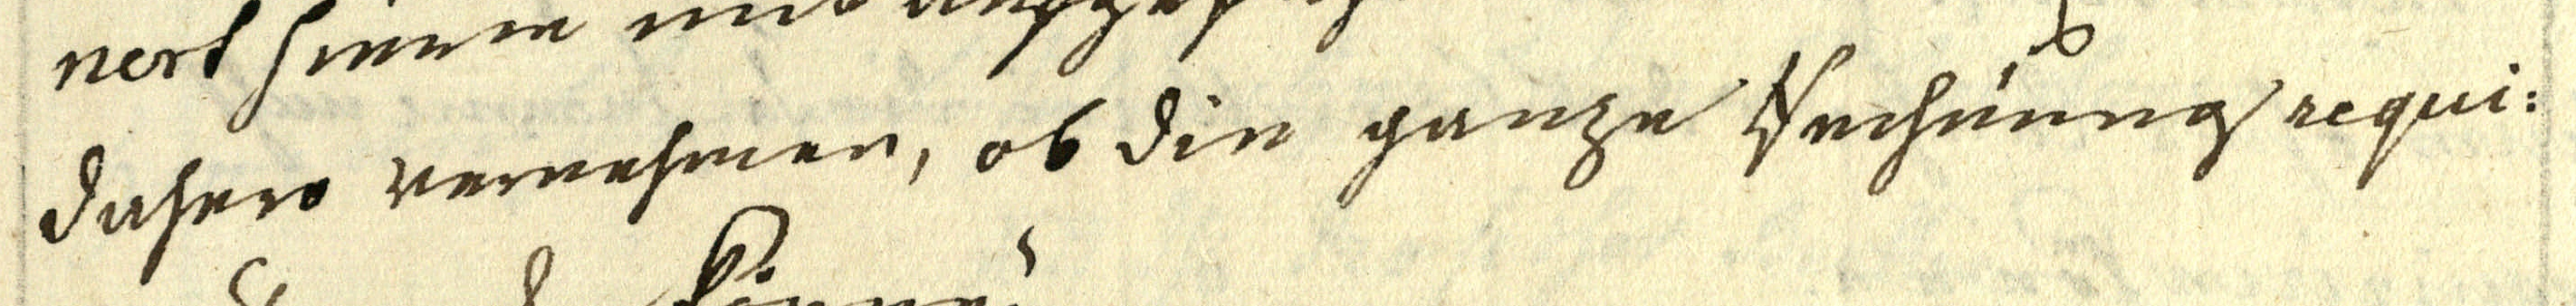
dahero vernehmen, ob die ganze Rechnung requi¬
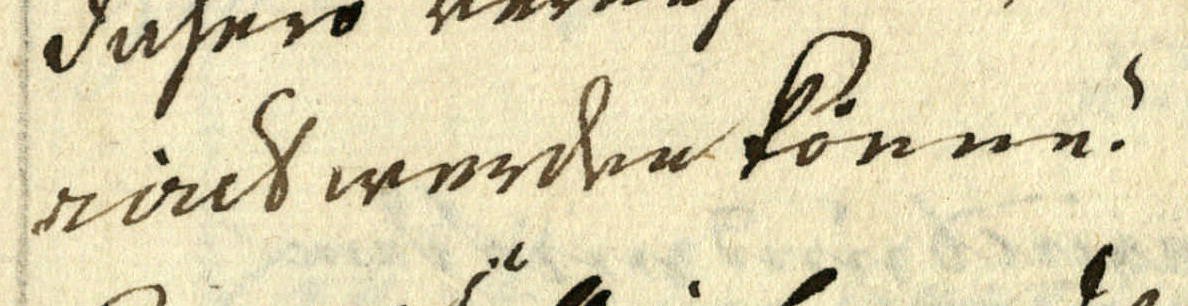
riret werden könne?
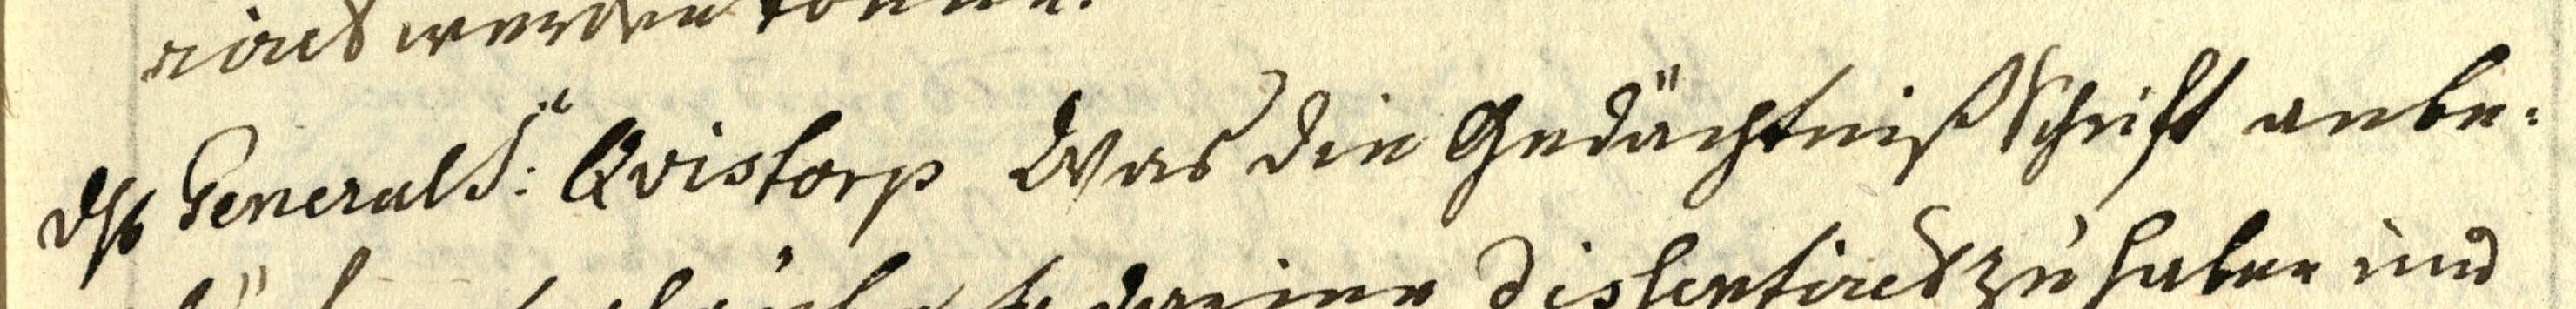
dh GeneralS. Quistorp Was die Gedächtniß Schrift anbe¬
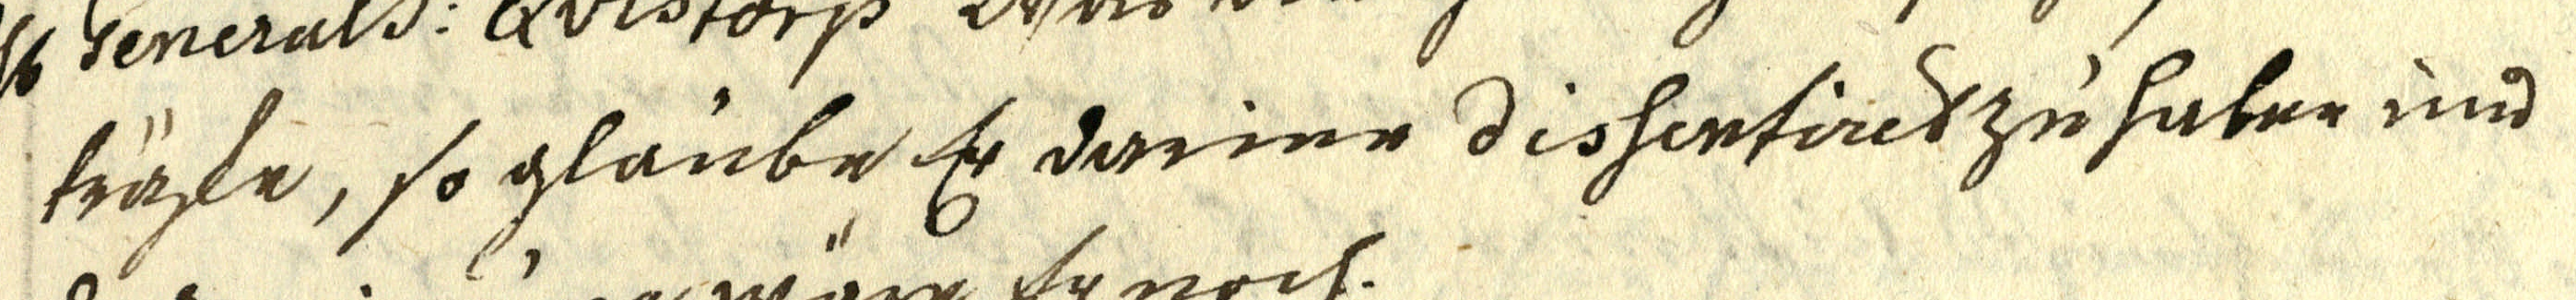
träfe, so glaube Er darinn dissentiret zu haben und
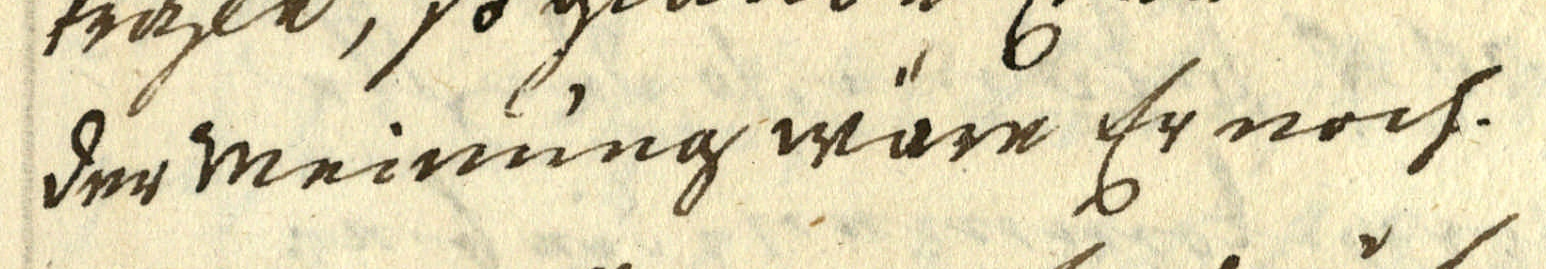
der Meinung wäre Er noch.
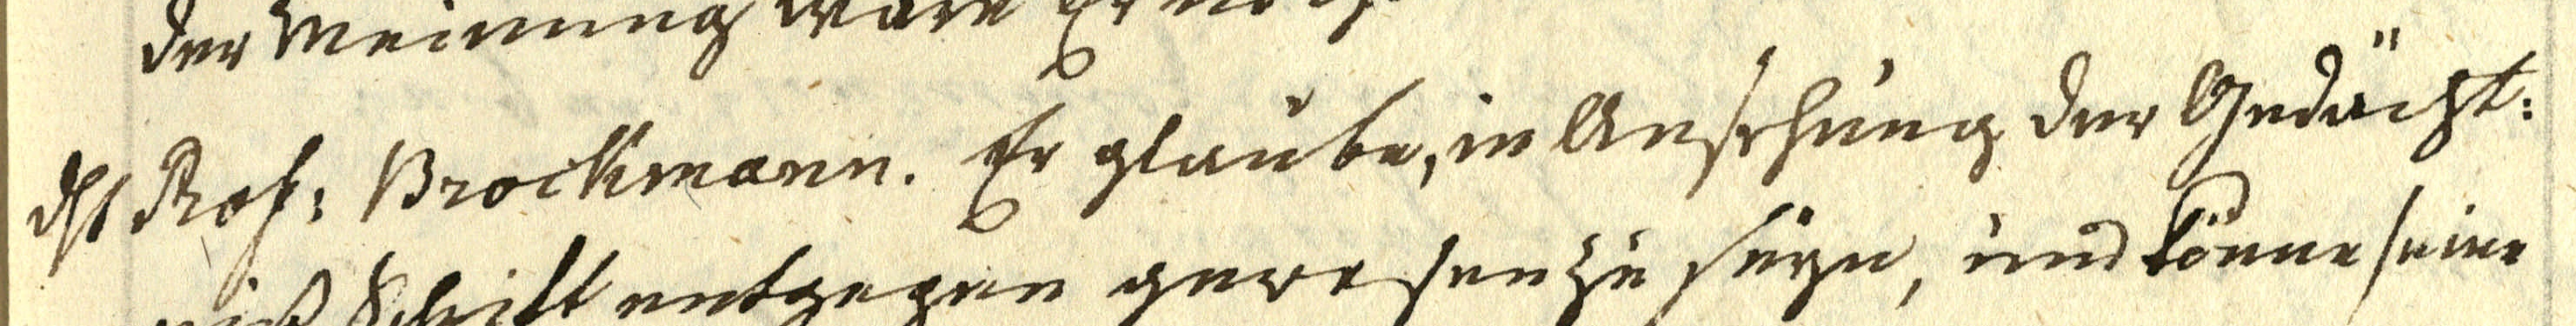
dh Prof. Brockmann. Er glaube, in Ansehung der Gedächt¬
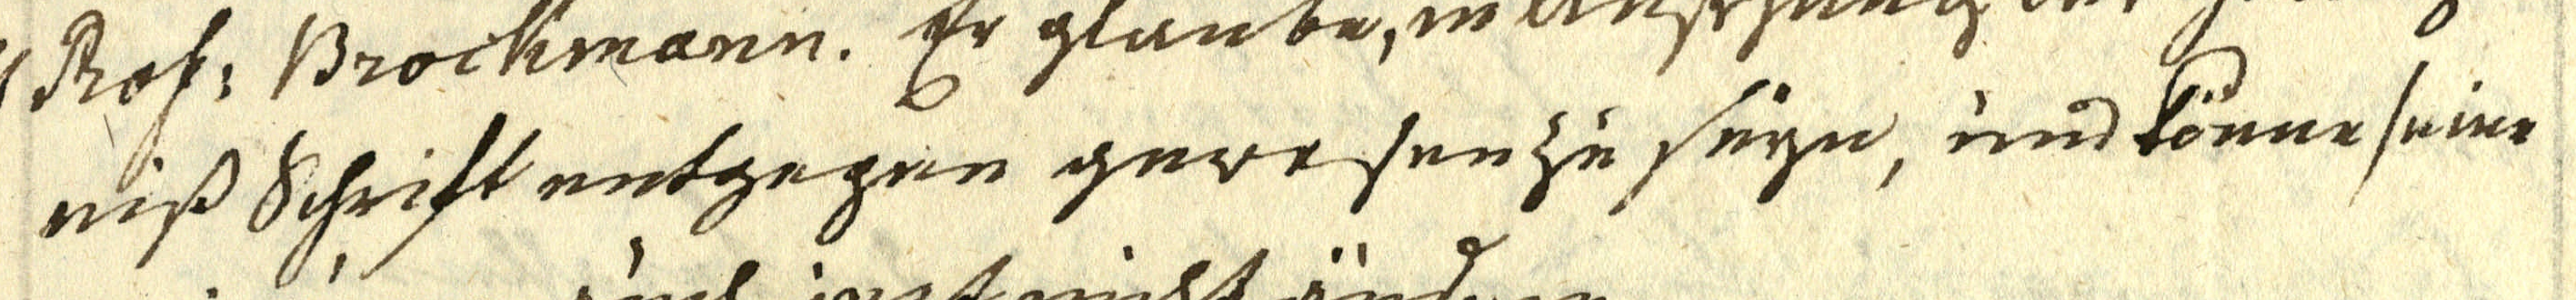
niß Schrift entgegen gewesen zu seÿn, und könne seine
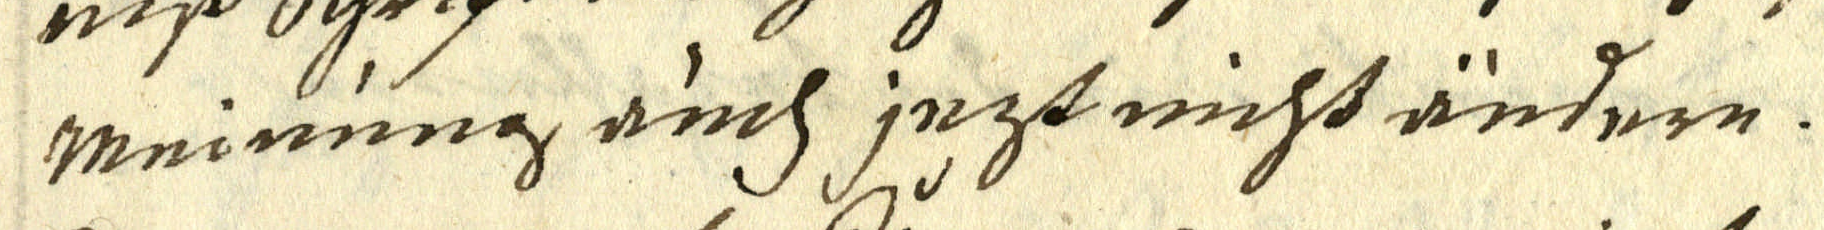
Meinung auch jezt nicht ändern.
